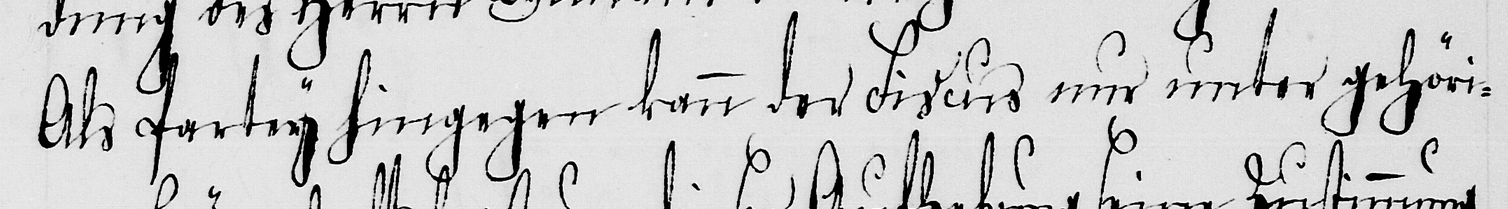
Als Partey hingegen kann der Fiscus nur unter gehöri¬
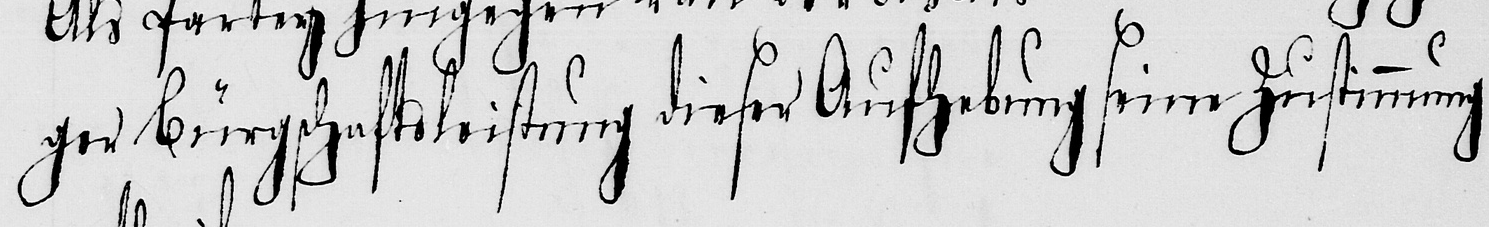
ger Bürgschaftsleistung dieser Aufhebung seine Zustim¬
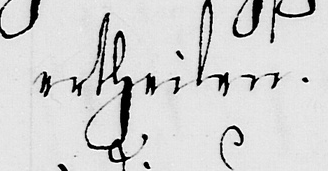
ertheilen.
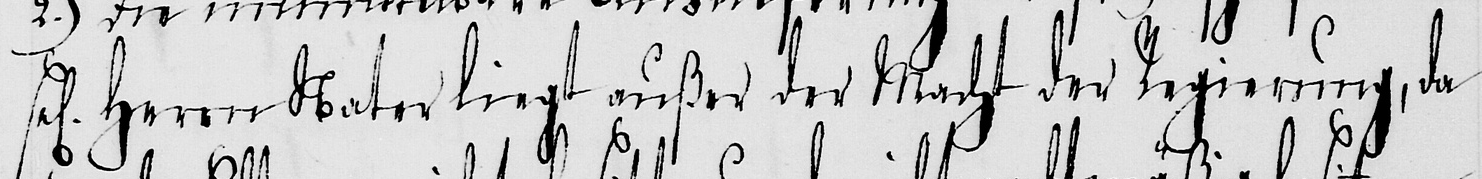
sel. Herrn Nater liegt außer der Macht der Regierung, da
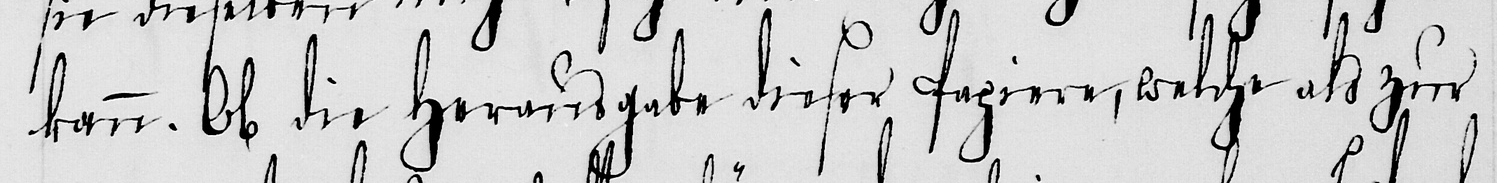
kann. Ob die Herausgabe dieser Papiere, welche als zur
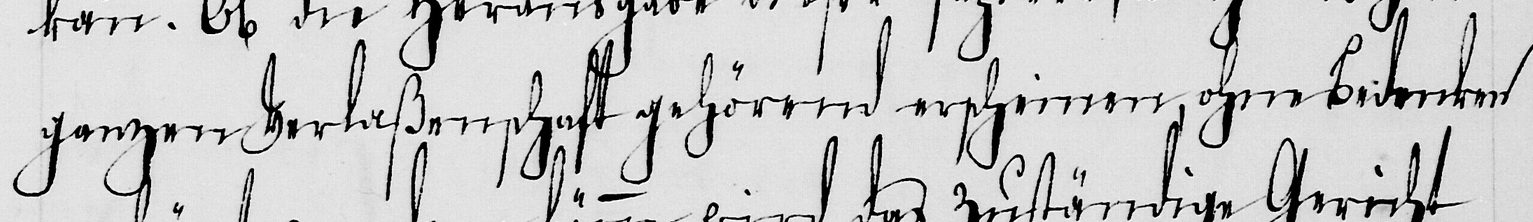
ganzen Verlaßenschaft gehörend erscheinen, ohne Bedenken
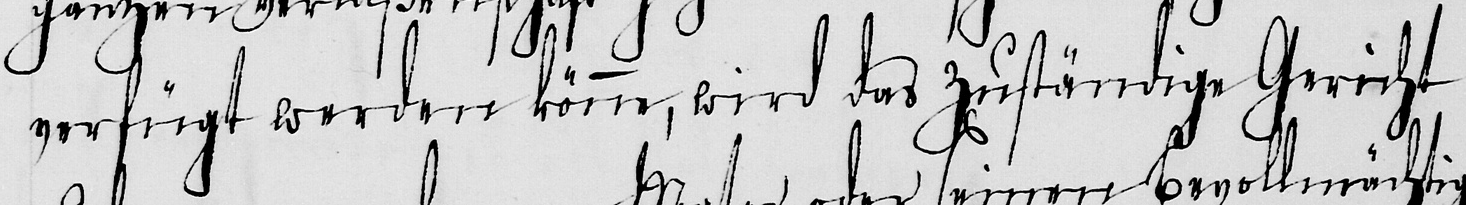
verfügt werden könne, wird das zuständige Gericht
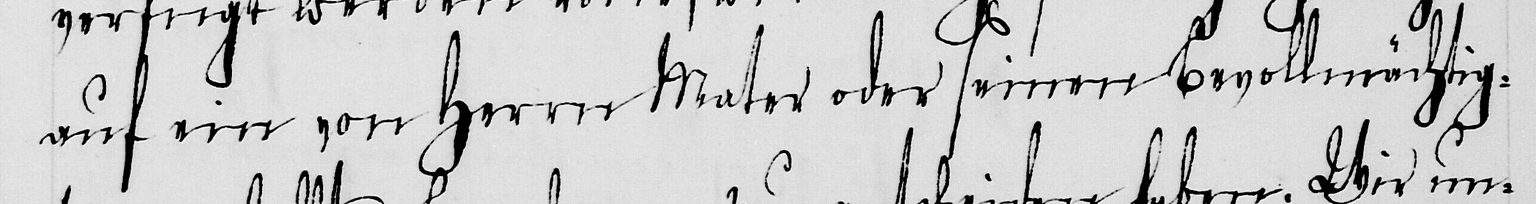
auf ein von Herrn Mater oder seinen Bevollmächtig¬
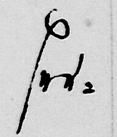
si¬
